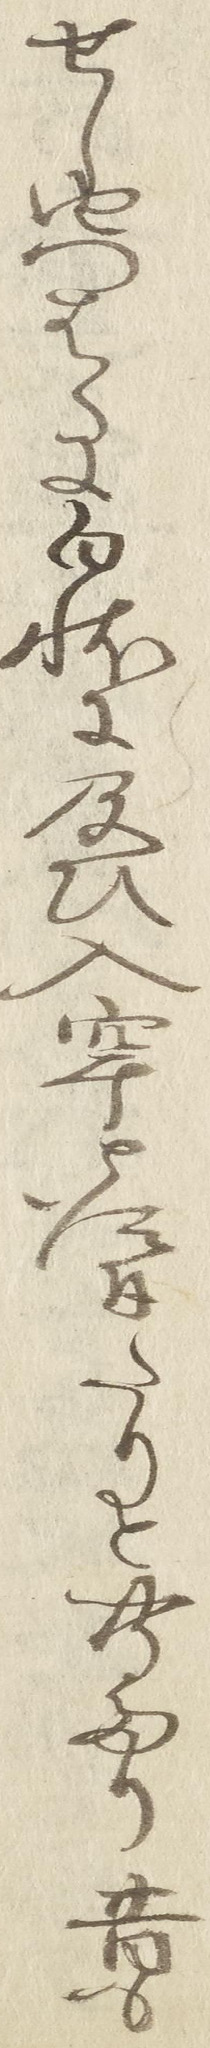せし由つはくに白状に及ひ入牢被仰付たりと聞たり昔も
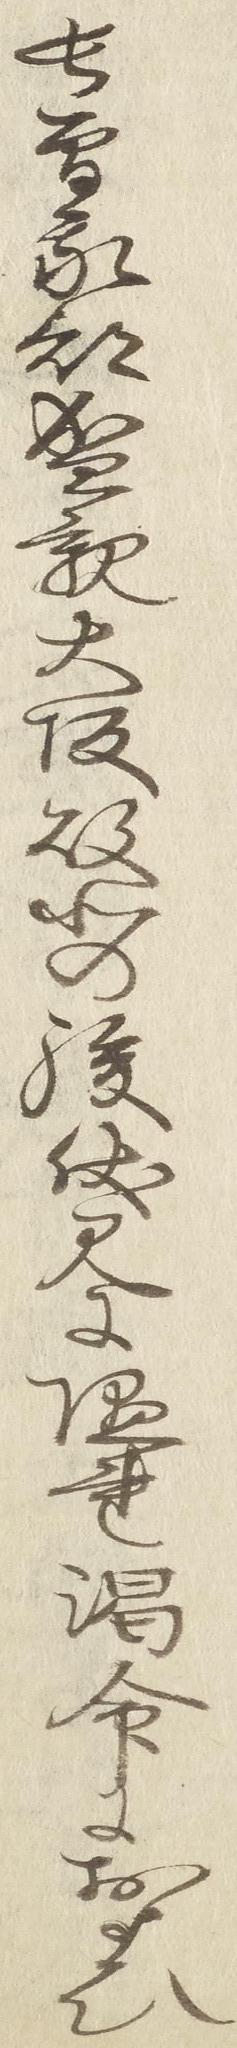長曽我部盛親大坂敗北の後伏見に隠れ渇命におよひ
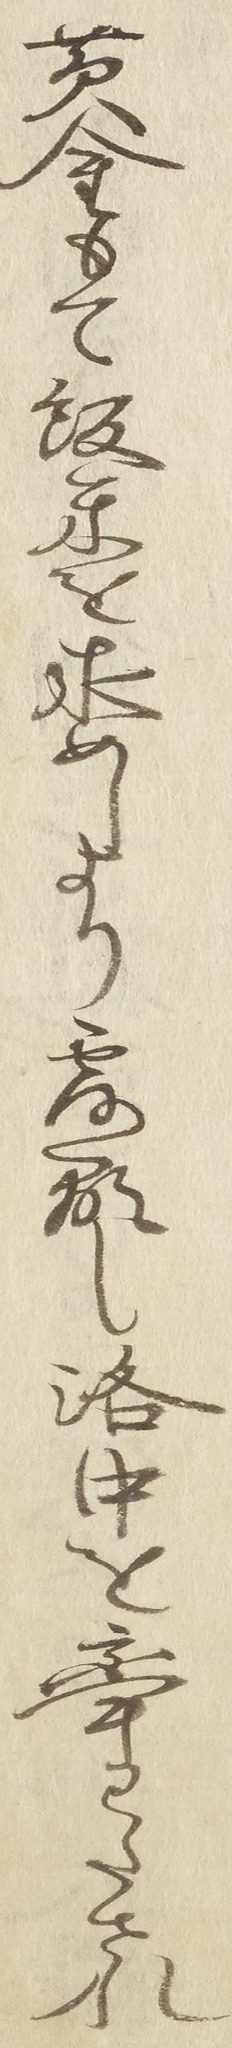黄金もて飯米を求めしより露見し洛中を牽わたされ

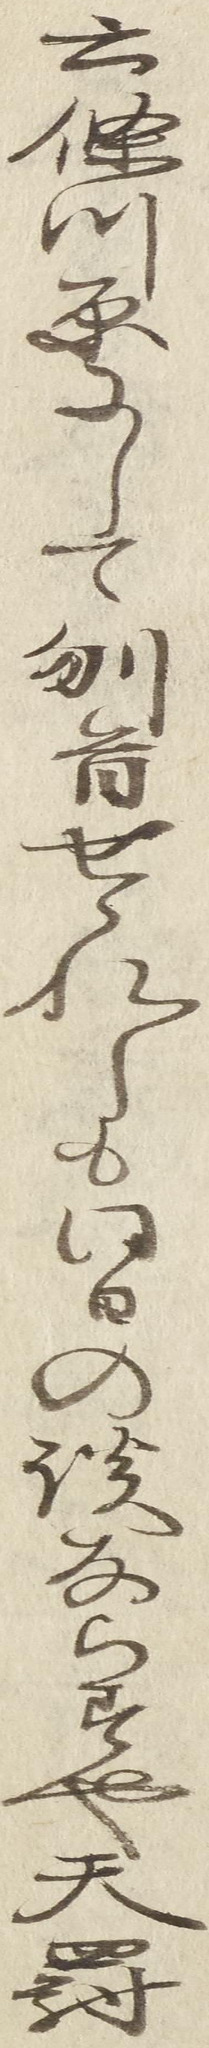六條川原にて刎首せられしも同日の談ならすや天罰
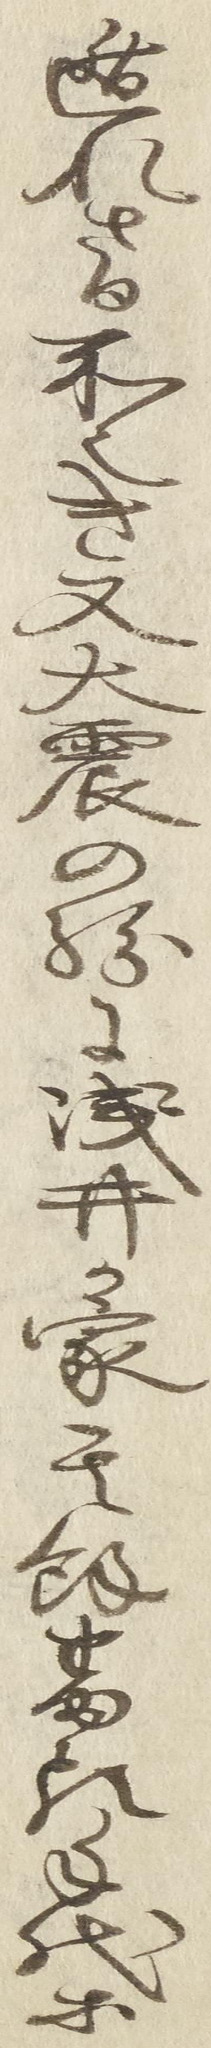遁れさる所也き又大震の紛に浅井の家其余番頭手代等
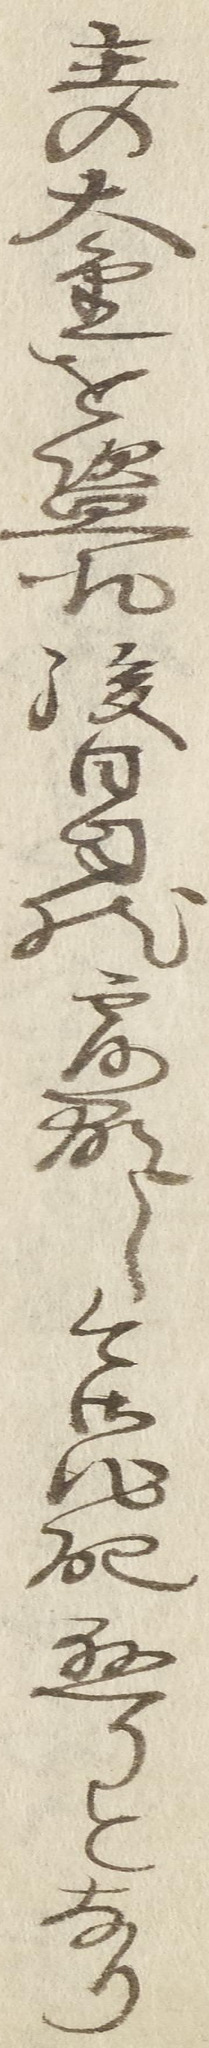主の大金を盗取後日自然露見し今御心配懸りとなり
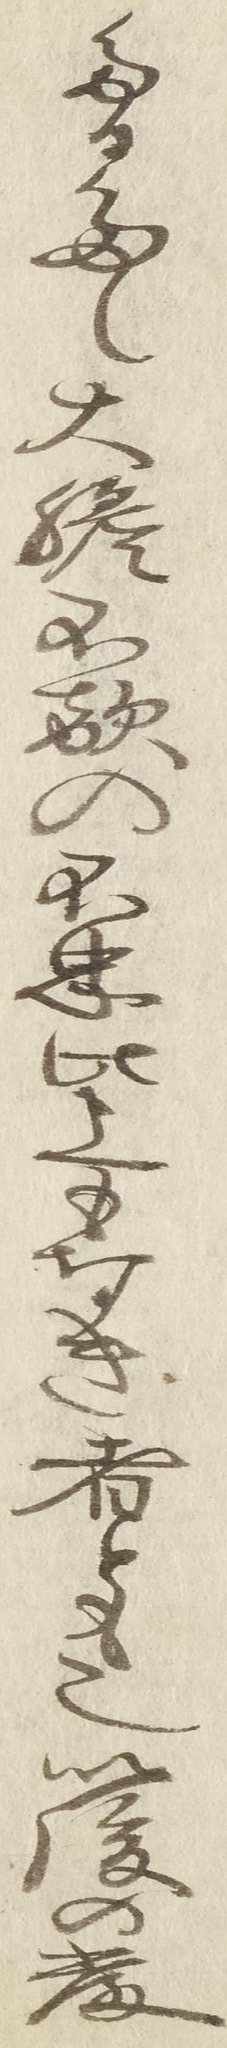たる多し大纔不敵の不忠此上もなき者とも也以後の厳
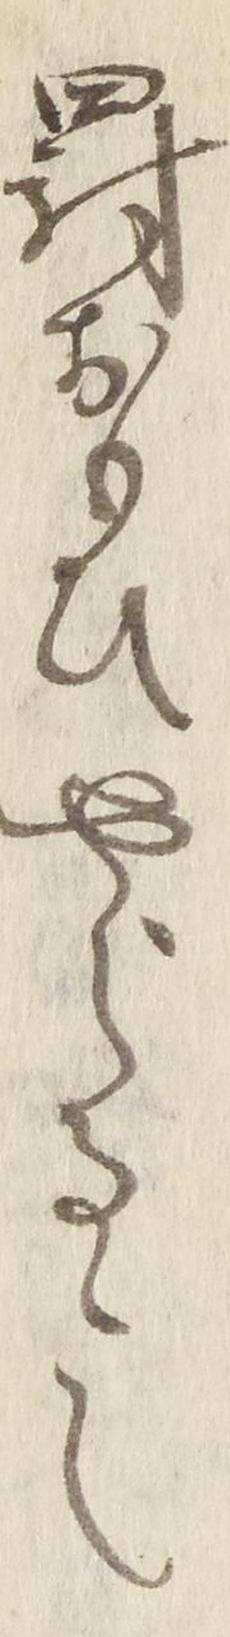罰おもひやらるゝ也
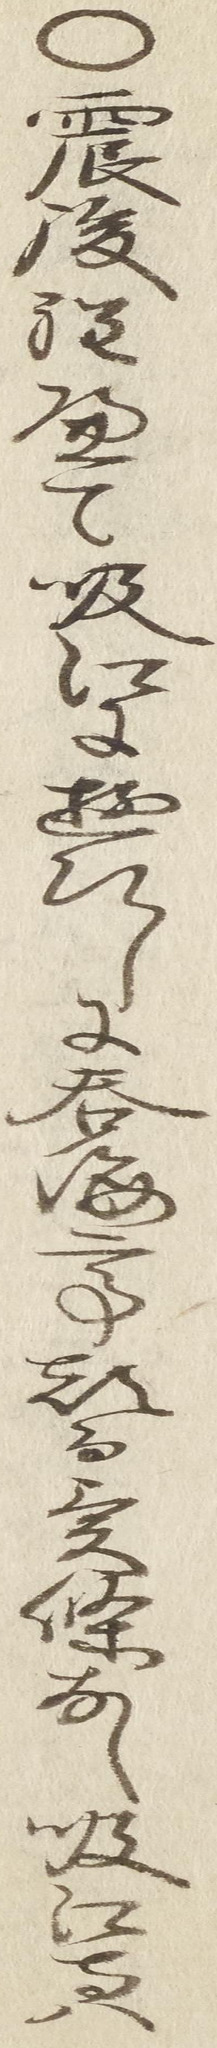〇震後程へて吸江に遊ひしに吞海亭都而意條なし吸江寺は
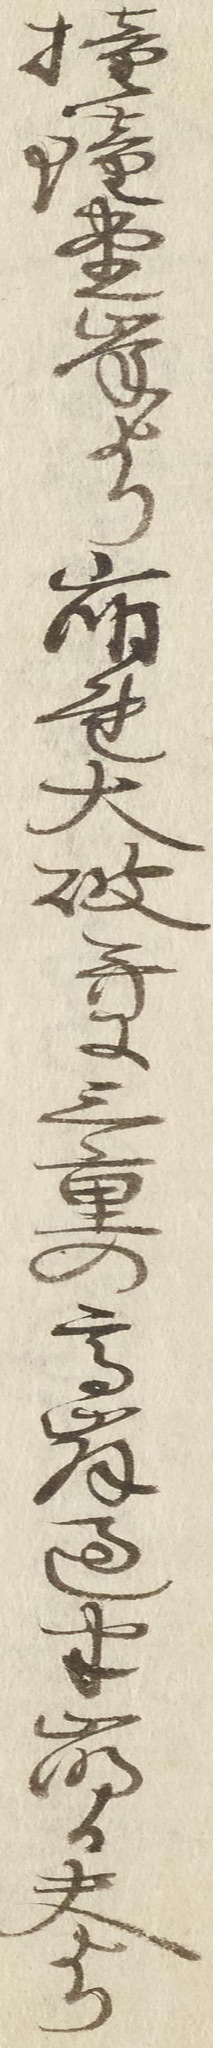撞鐘堂岸より崩れ大破幷に三重の高岸通半崩る夫より
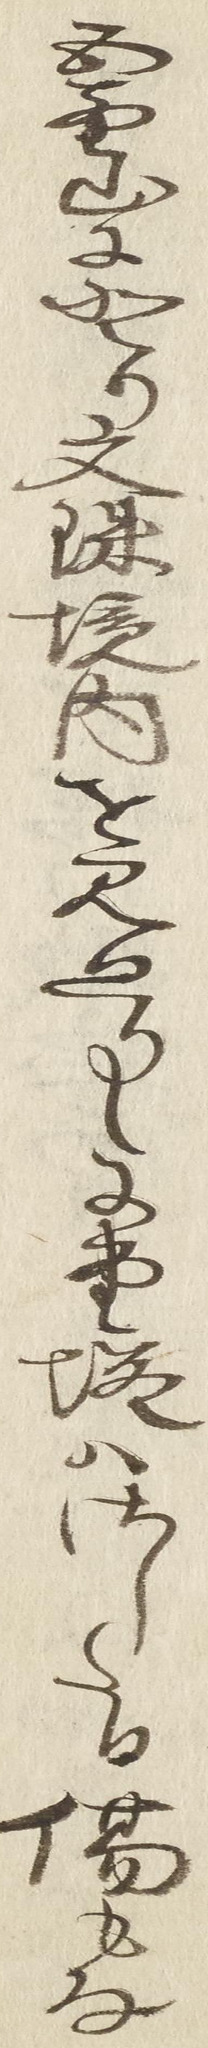五台山に登り文殊境内を見廻りしに堂塔はさしたる傷もな
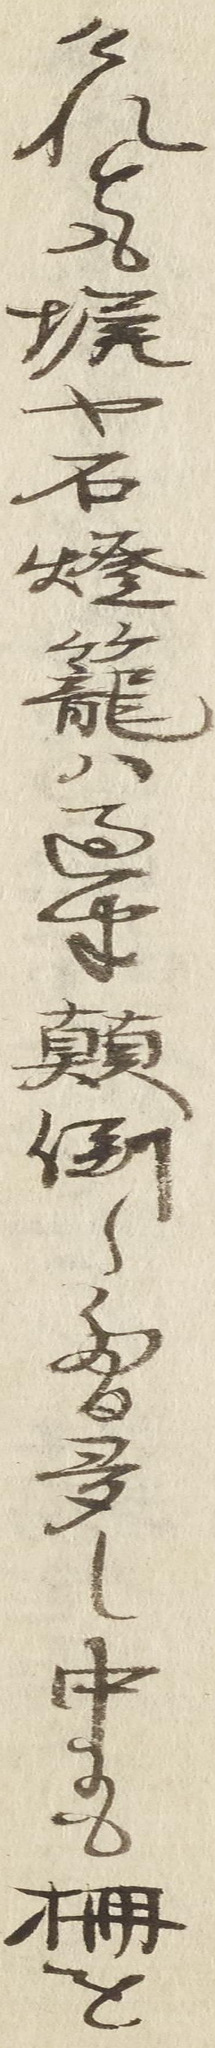けれとも塀や石燈籠は過半顛倒したる多し中にも柵を
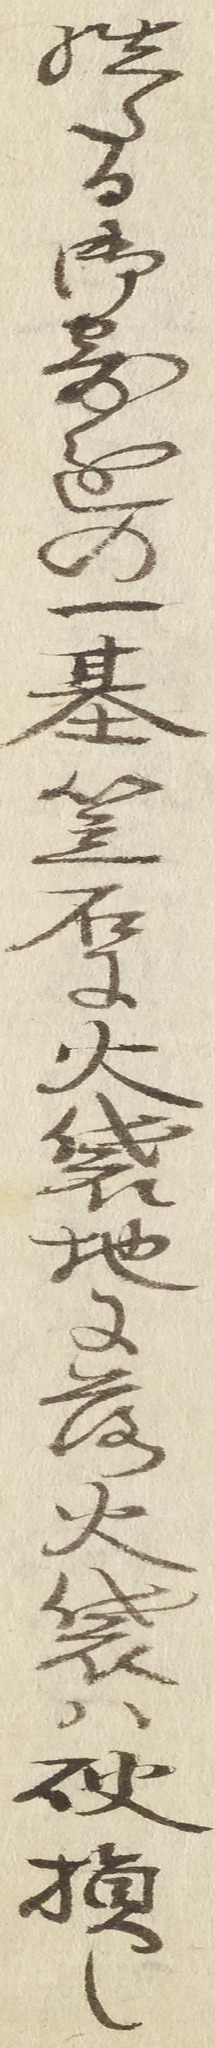結？たる御寄進の一基笠石に火袋地に落火袋は破損し
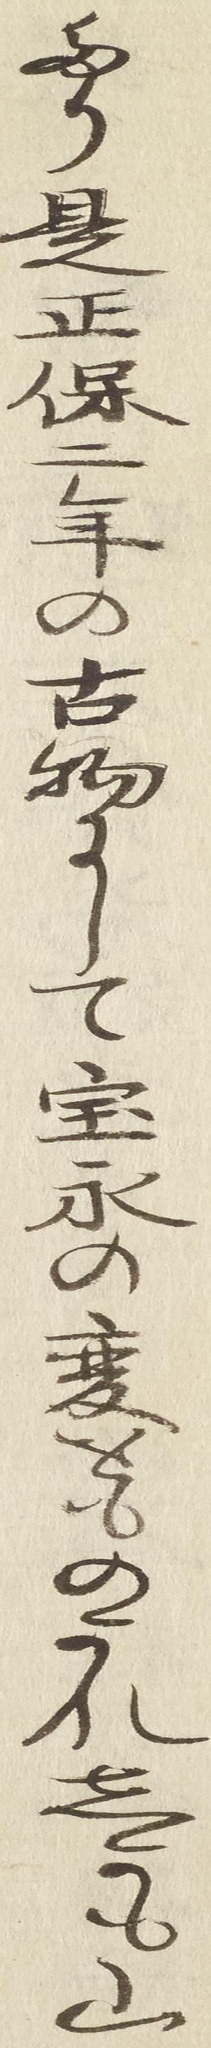たり是正保二年の古物にして宝永の変をものかれしかも山
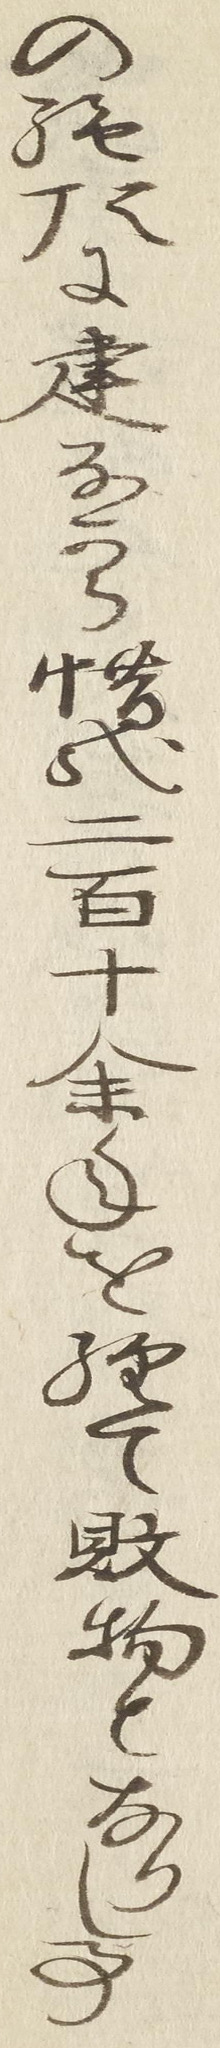の絶頂に建なから惜哉二百十余年を経て敗物となりし事
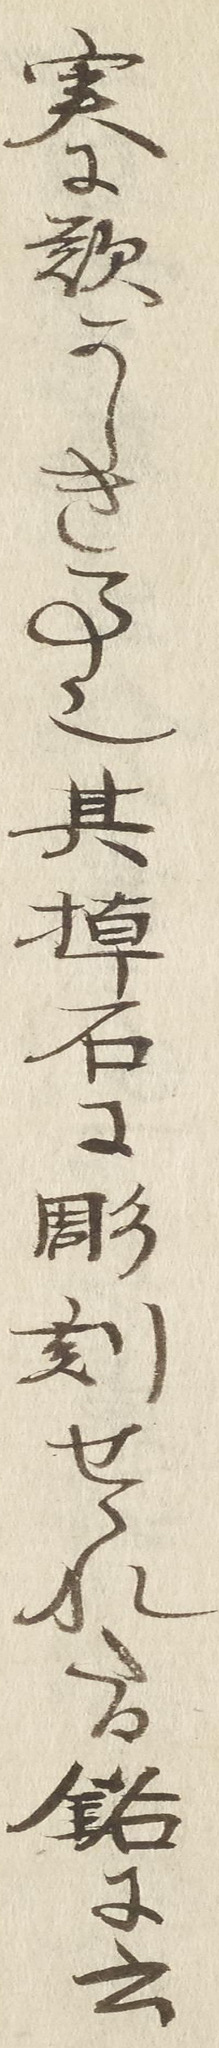実に歎かしき事也其棹石に彫刻せられたる銘に云
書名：地震記　上
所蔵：東京大学地震研究所図書室 Earthquake Research Institute Library, The University of Tokyo, JAPAN
